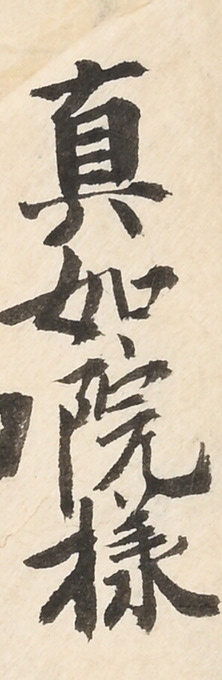真如院様

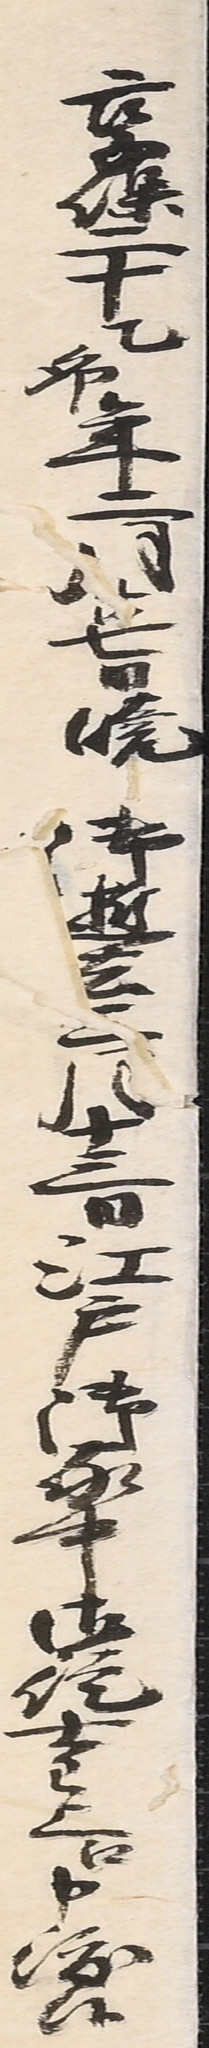真如院様享保二十乙卯年二月廿七日暁御逝去三月十三日江戸御家中御徒士已上江申渡候
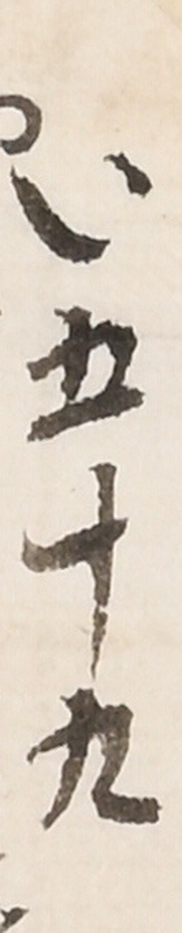い五十九
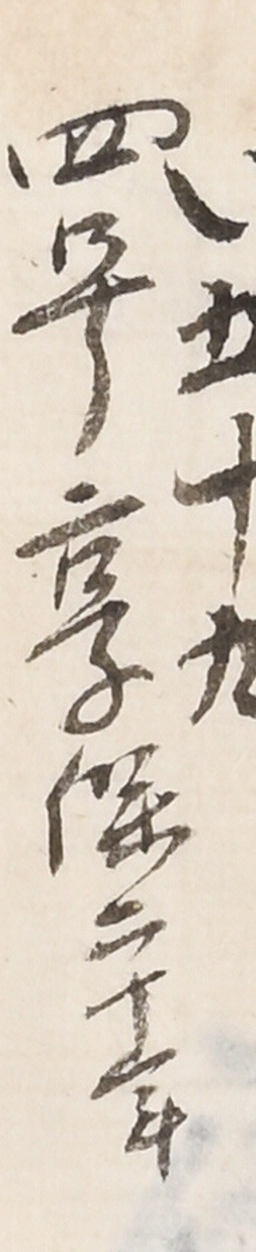四号享保二十年
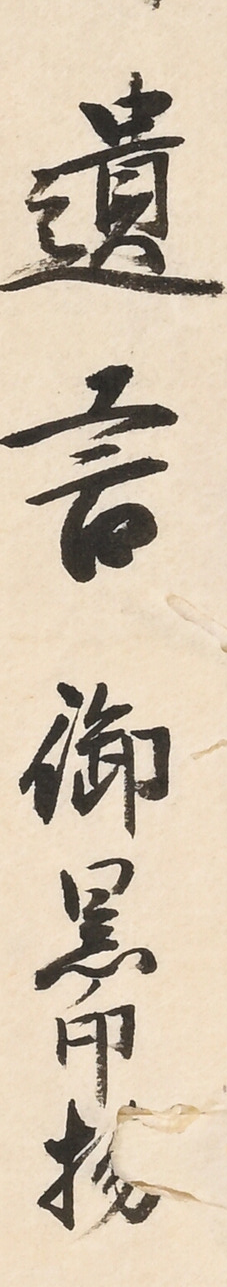御遺言御黒印物
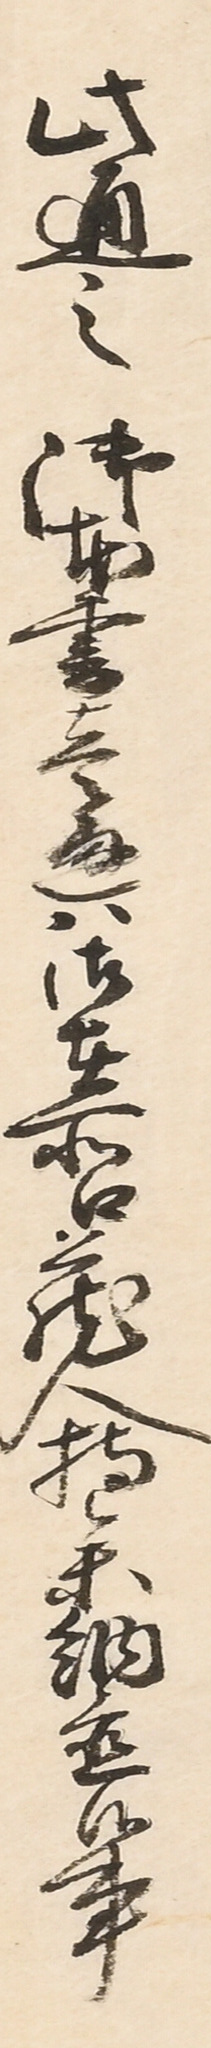此通之御本書壱通ハ御在所江蔵人持参納置候事

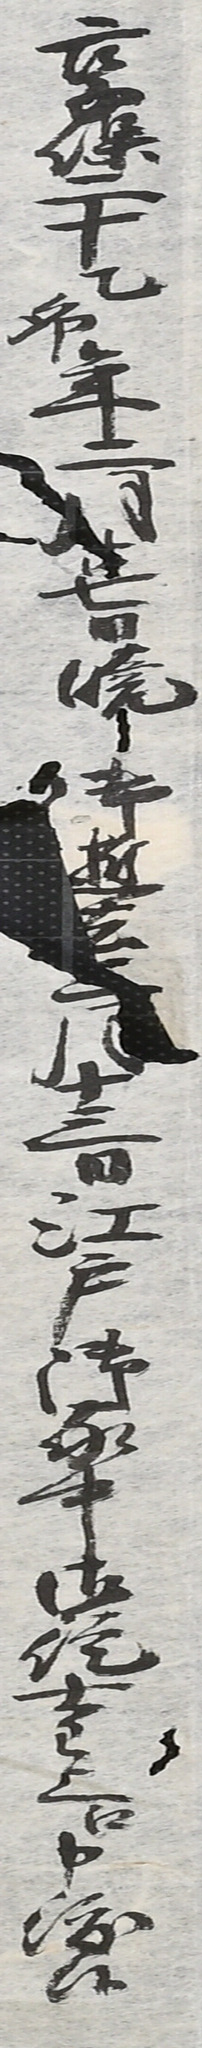真如院様享保二十乙卯年二月廿七日暁御逝去三月十三日江戸御家中御徒士已上江申渡候
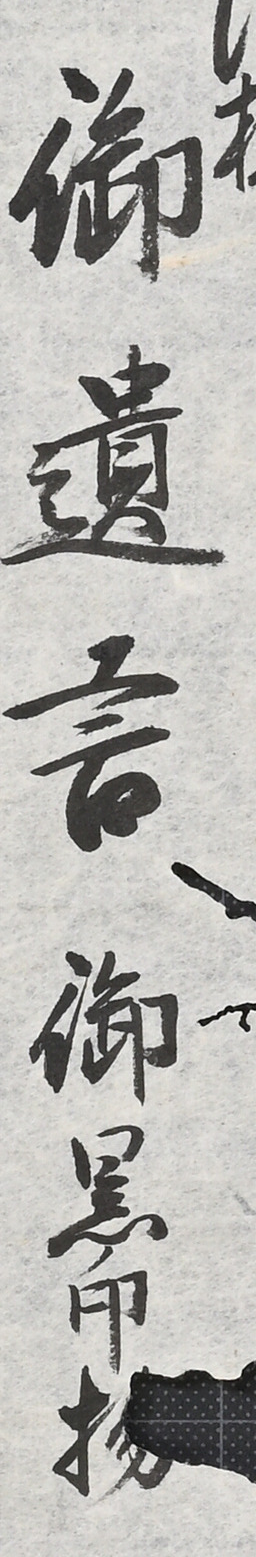御遺言御黒印物
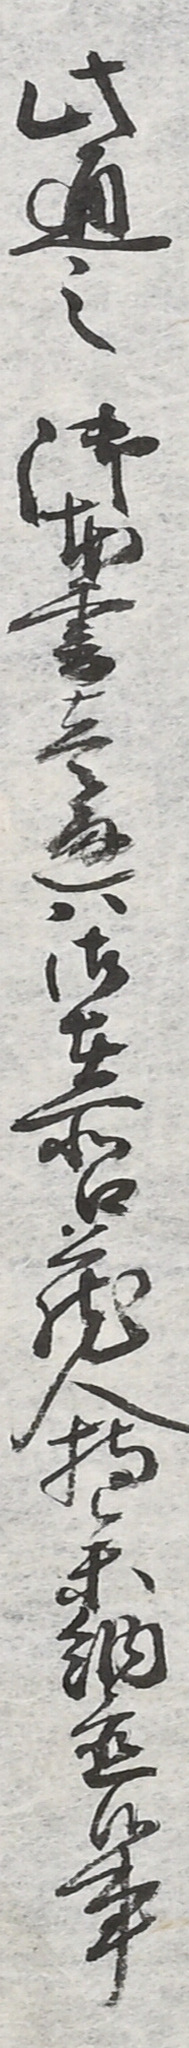此通之御本書壱通ハ御在所江蔵人持参納置候事

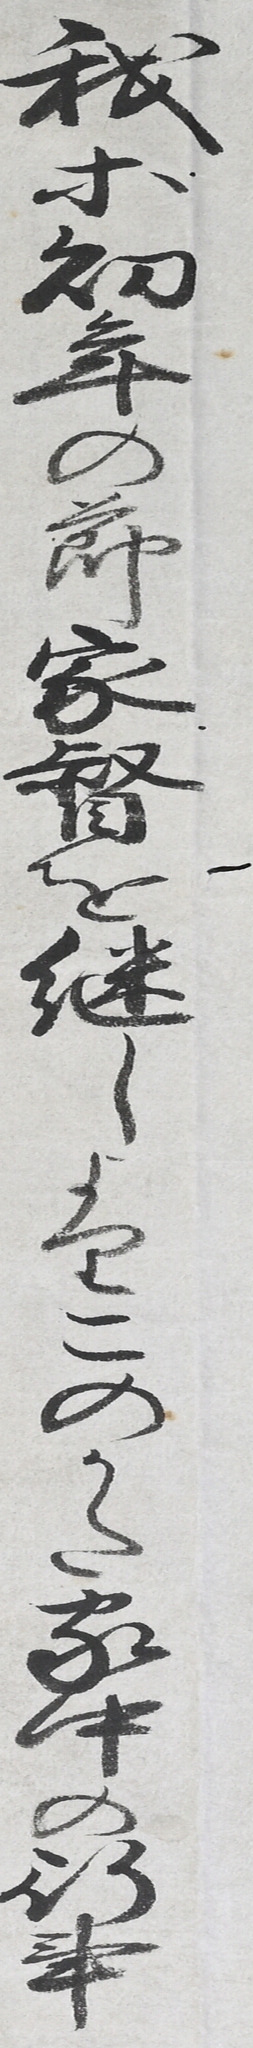我等幼年の節家督を継しよりこのかた家中の行事
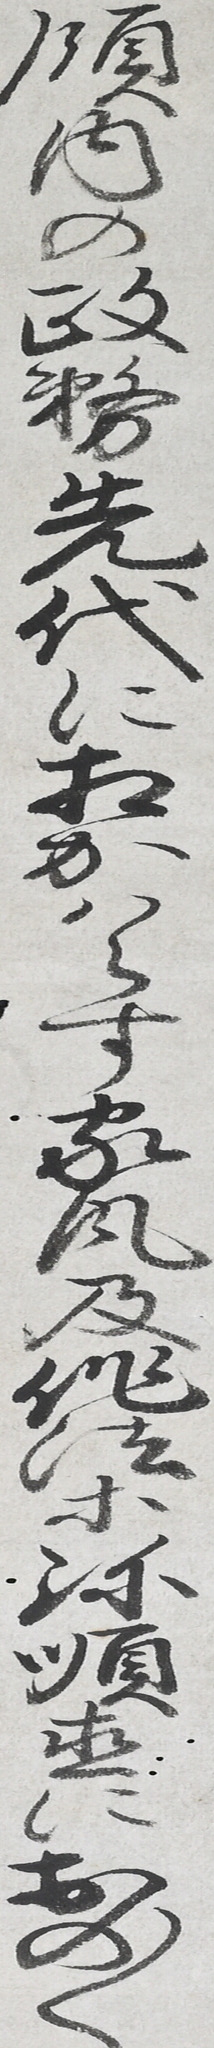領内の政務先代に相かハらす家風及作法等弥順直におの〳〵
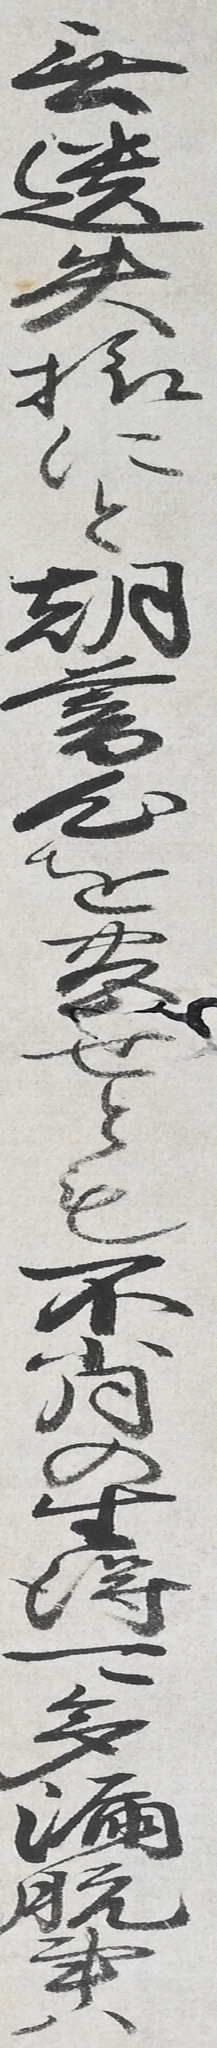無遺失様にと朝暮心を尽せとも不肖の生得可多漏脱事ハ
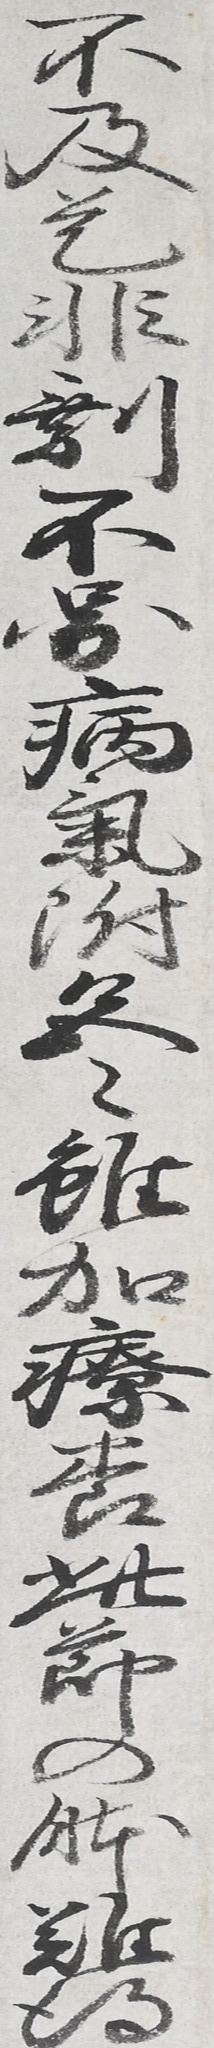不及是非剰不図病気附色々雖加療養此節の躰難得
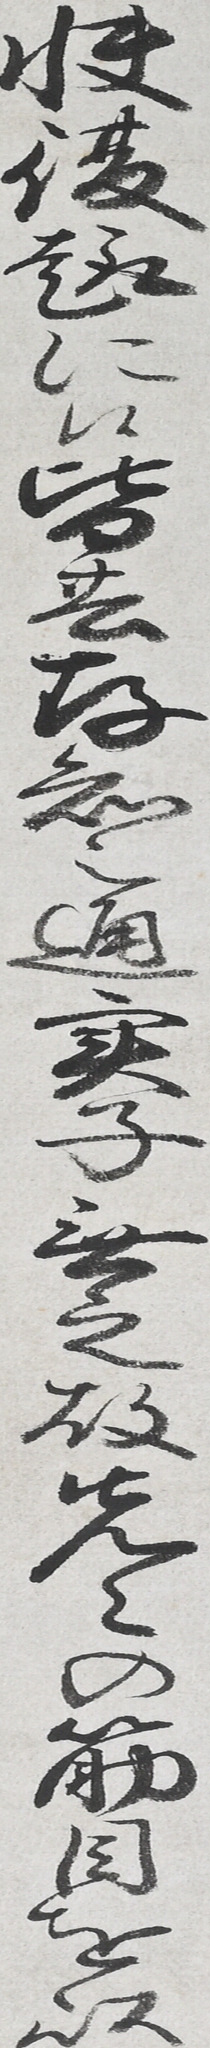快復趣に候皆共存知之通実子無之故先々の筋目を以
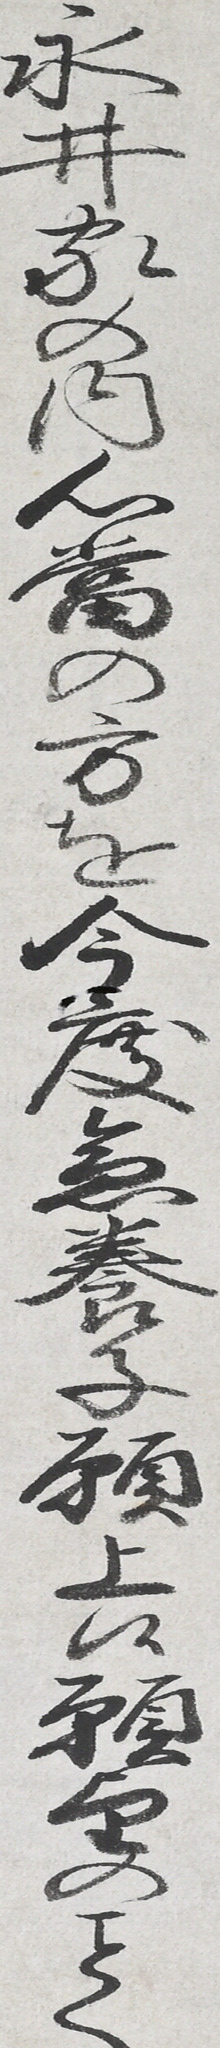永井家の内心当の方を今度急養子願上候願望のことく
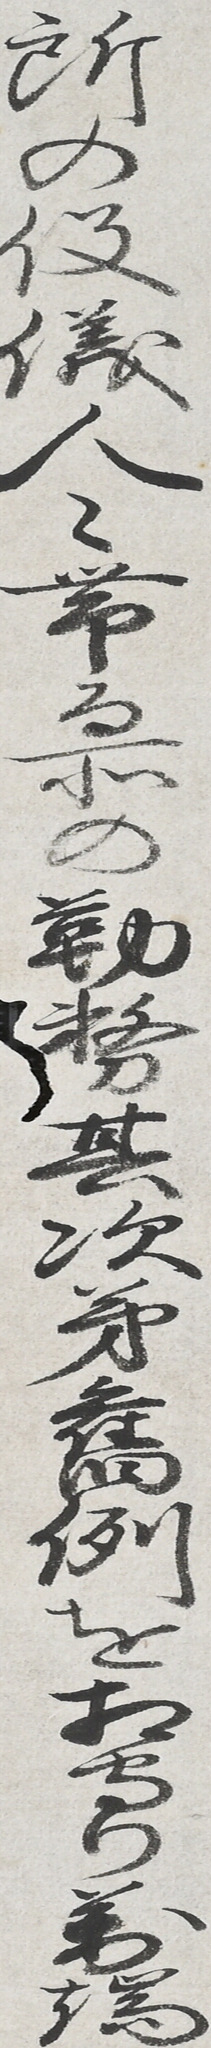所の役儀人々帯る所の勤務其次第旧例を相守り万端
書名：真如院様御遺言
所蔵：伊那市立高遠町図書館・合同会社AMANE
